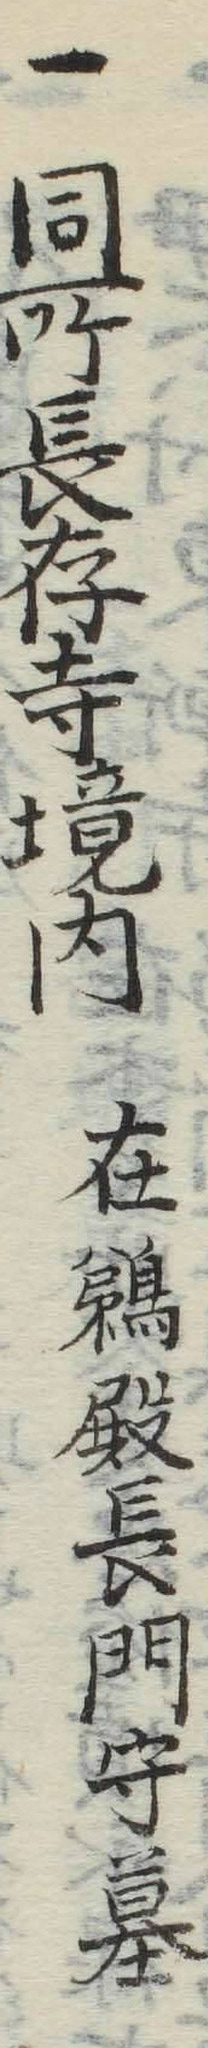一同所長存寺境内在鵜殿長門守墓
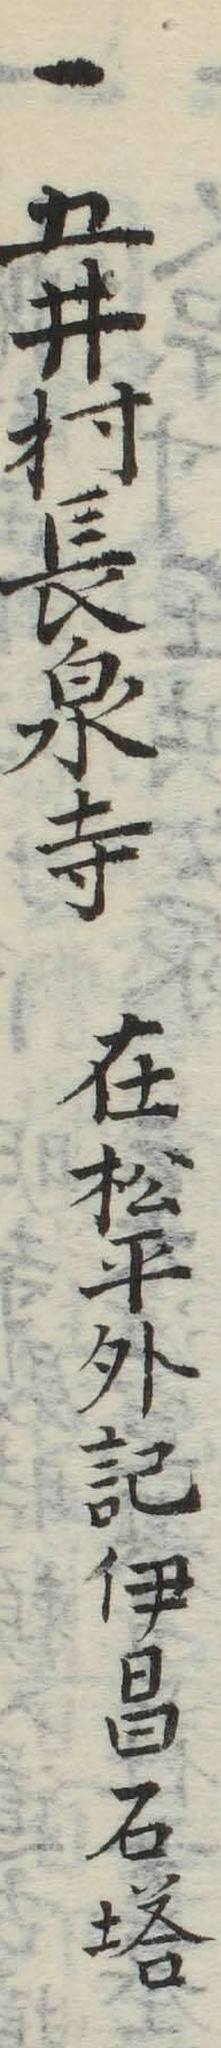一五井村長泉寺在松平外記伊昌石塔
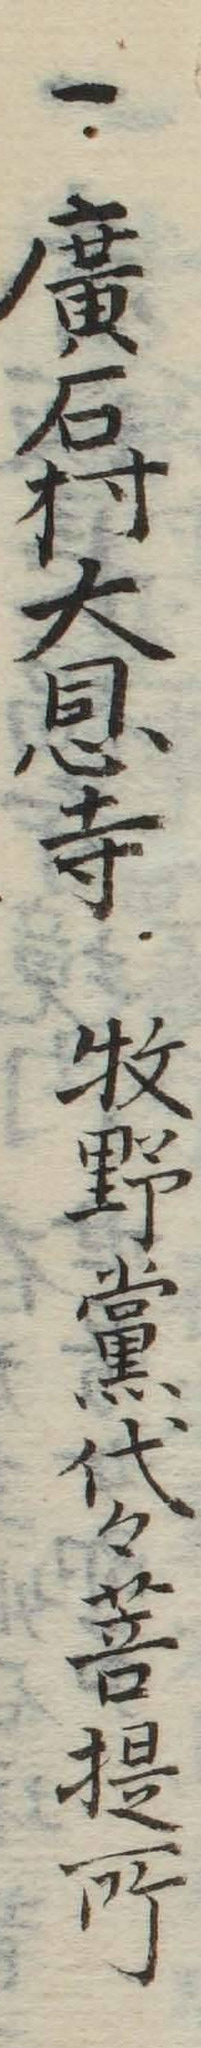一広石村大恩寺牧野党代々菩提所

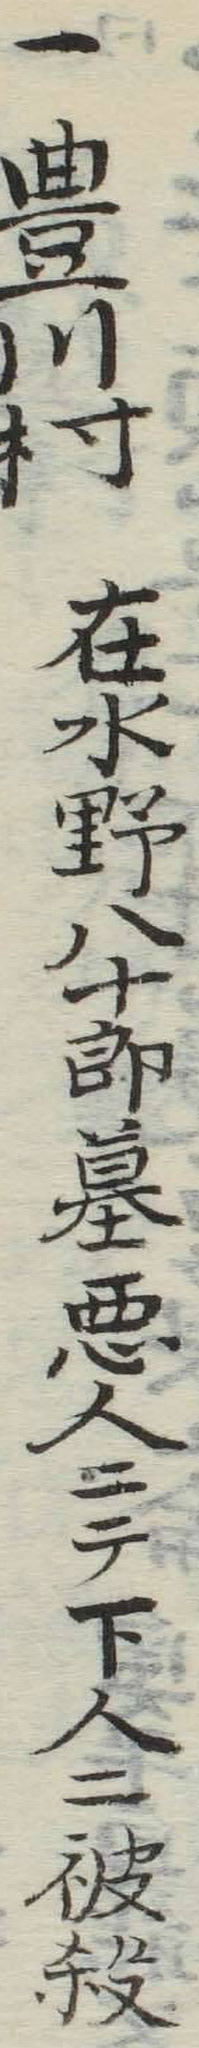一豊川村在水野八十朗墓悪人ニテ下人ニ被殺

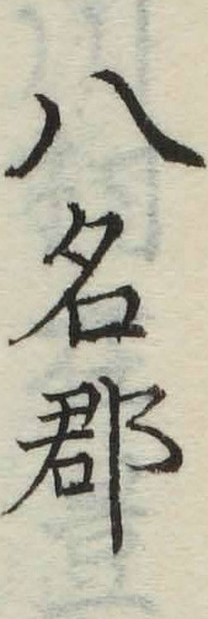八名郡
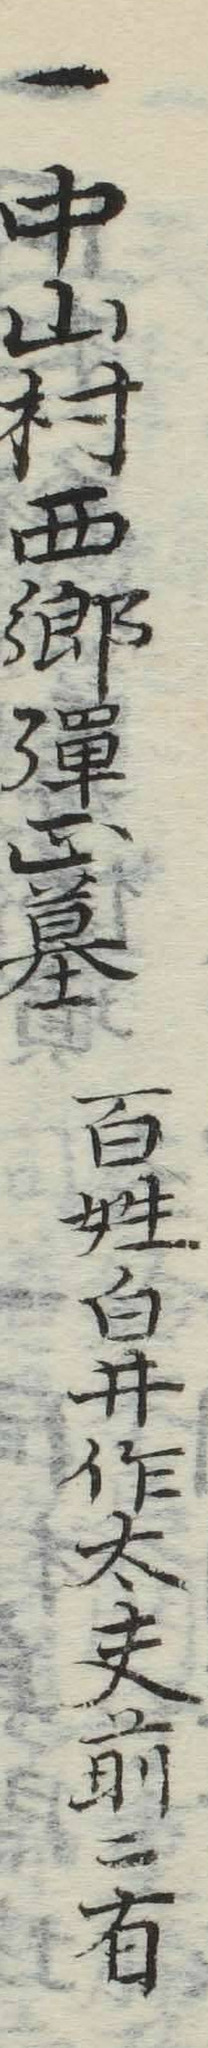一中山村西郷弾正墓百姓白井作太夫前ニ有

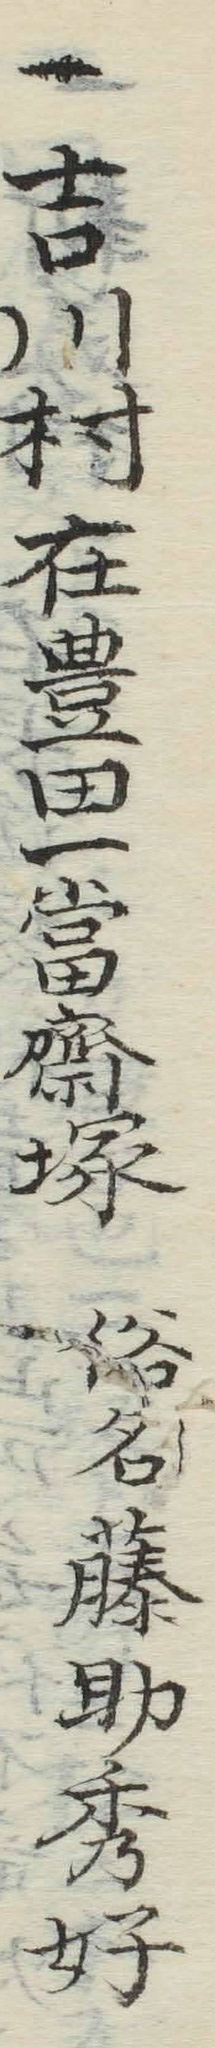一吉川村在豊田一当齋塚俗名藤助秀好
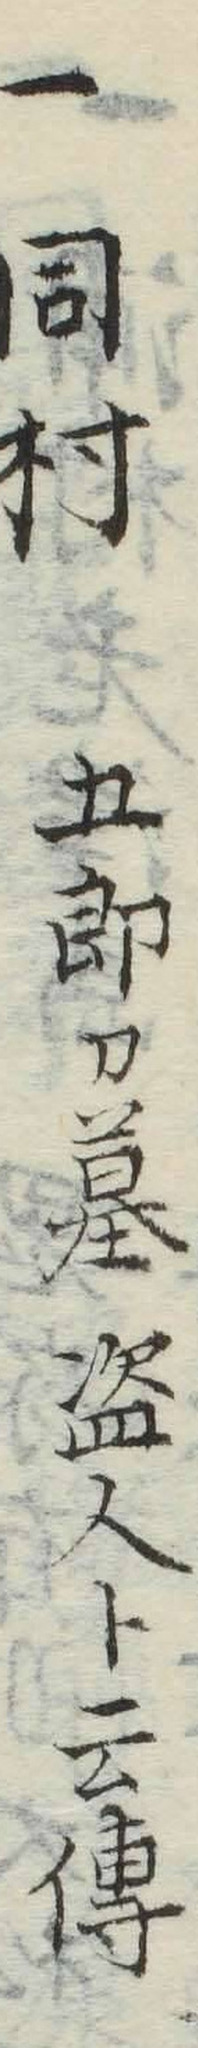一同村五郎カ墓盗人ト云伝
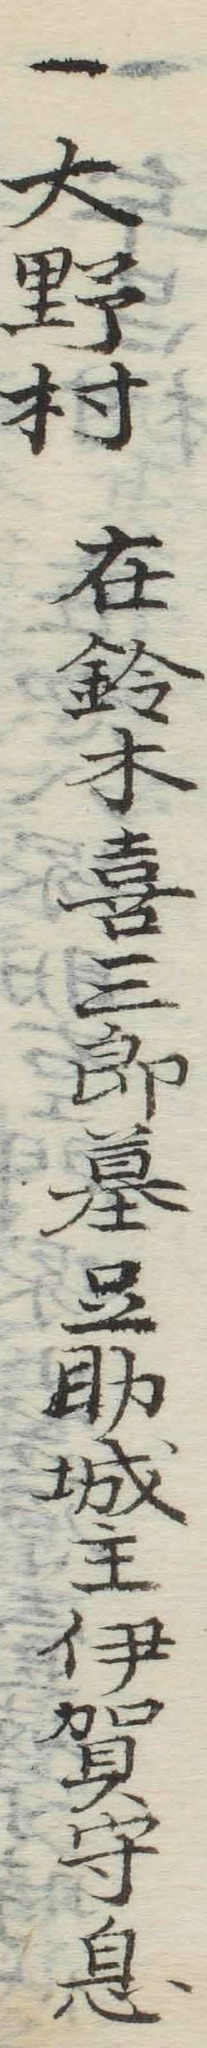一大野村在鈴木喜三郎墓足助城主伊賀守息
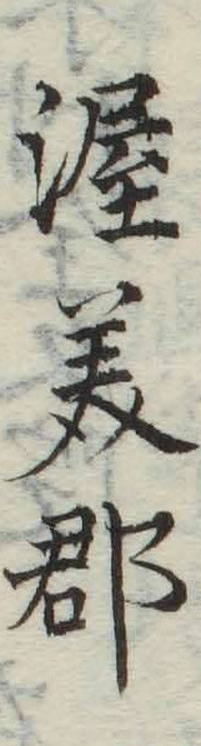渥美郡

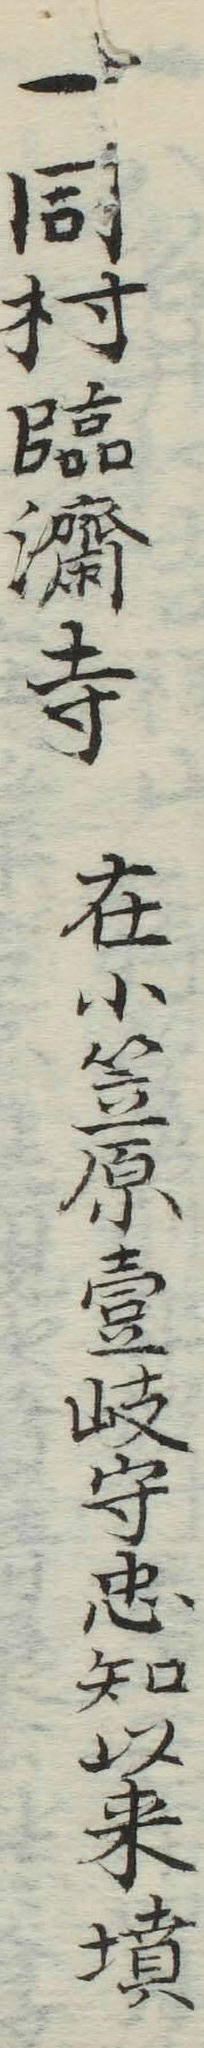一同村臨濟寺在小笠原壱岐守忠知以来墳
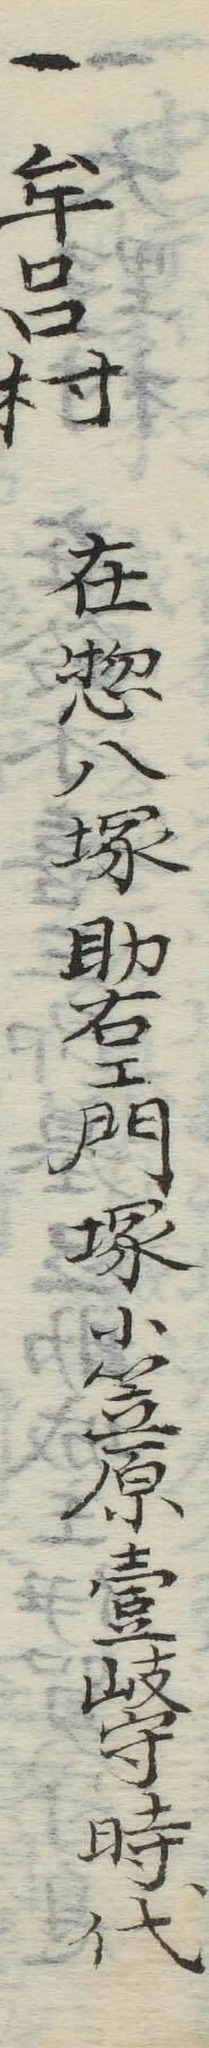一牟呂村在惣八塚助右エ門塚小笠原壱岐守時代
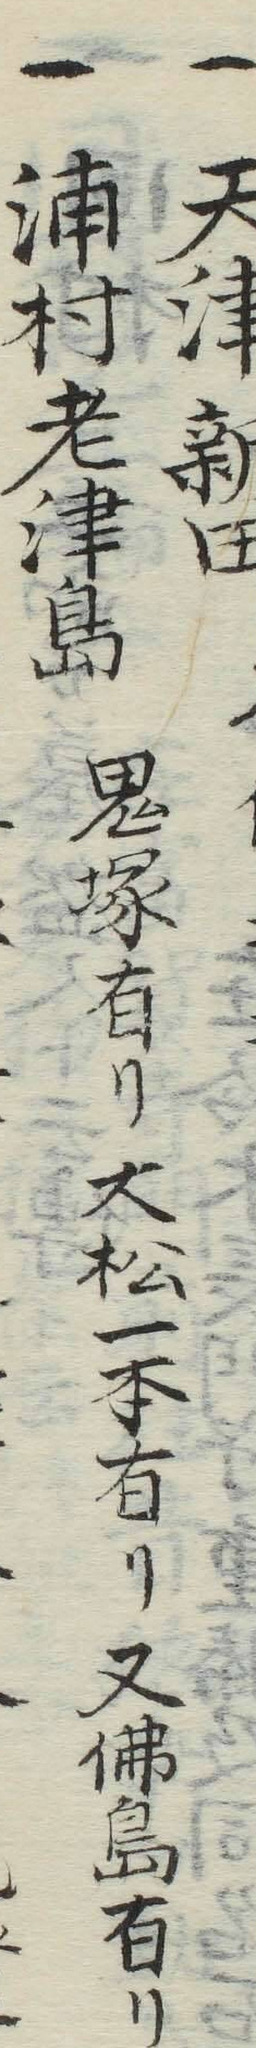一浦村老津島鬼塚有リ大松一本有リ又仏島有リ
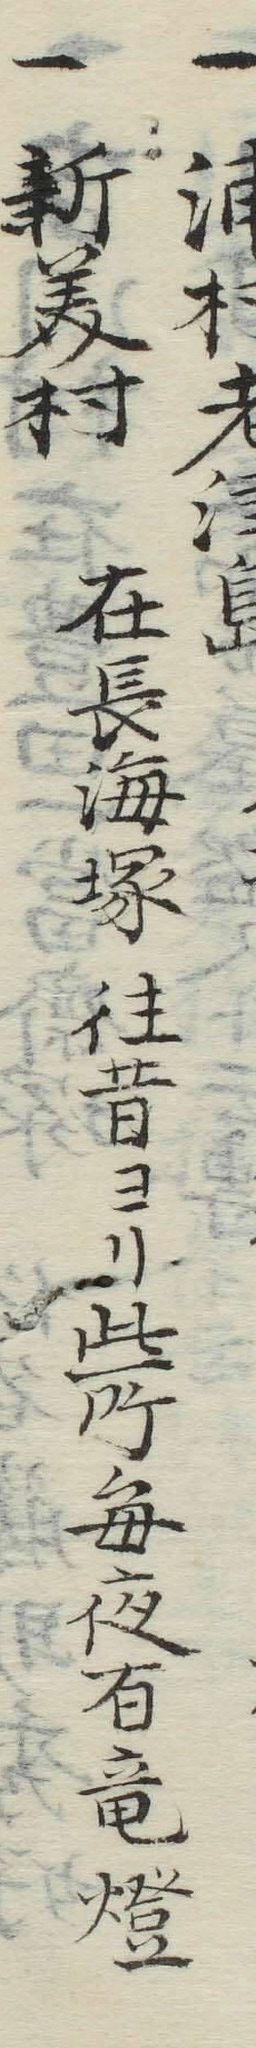一新美村在長海塚往昔ヨリ此所毎夜有竜燈
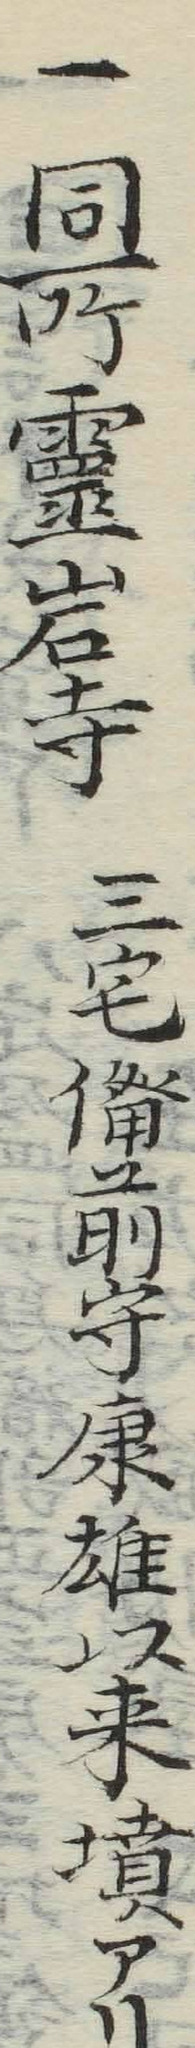一同所霊岩寺三宅備前守康雄以来墳アリ
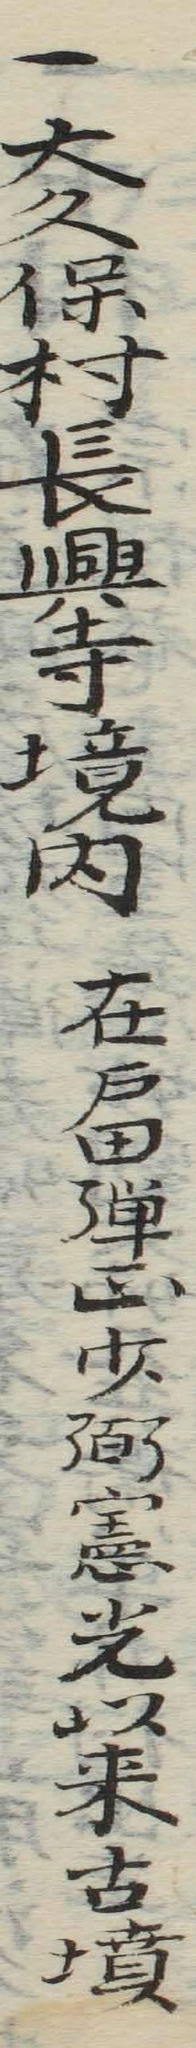一大久保村長興寺境内在戸田弾正少弼憲光以来古墳
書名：三河国二葉松
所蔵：国文学研究資料館
